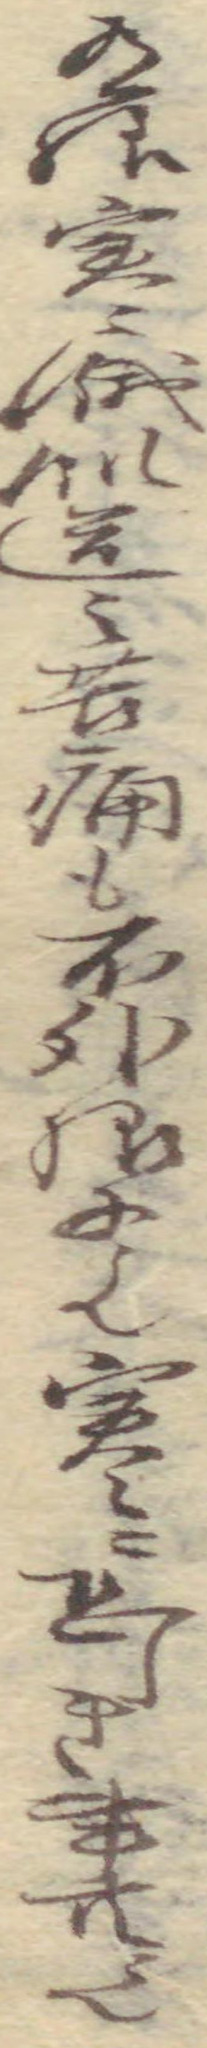有様実ニ餓飢道之苦痛も不外様子ニて実〻ニ恐しき事共ニて
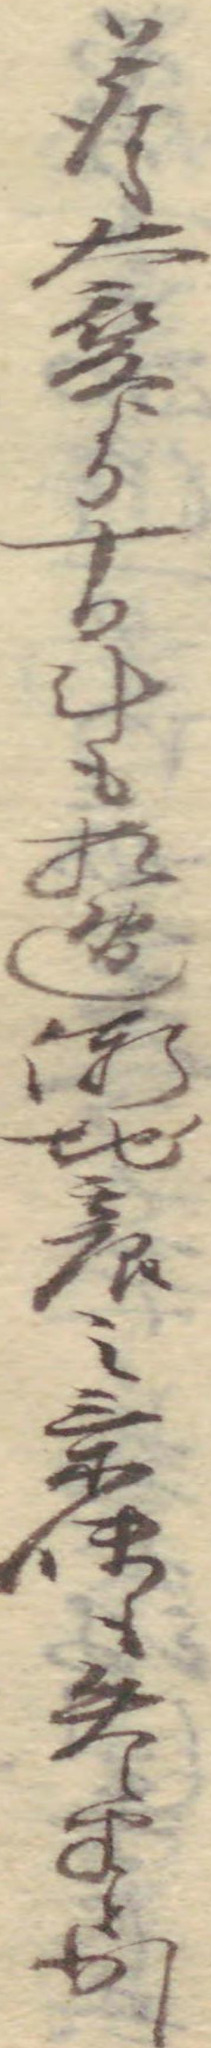御座候大変より十日計も相過漸地震之気味も失候半と少し
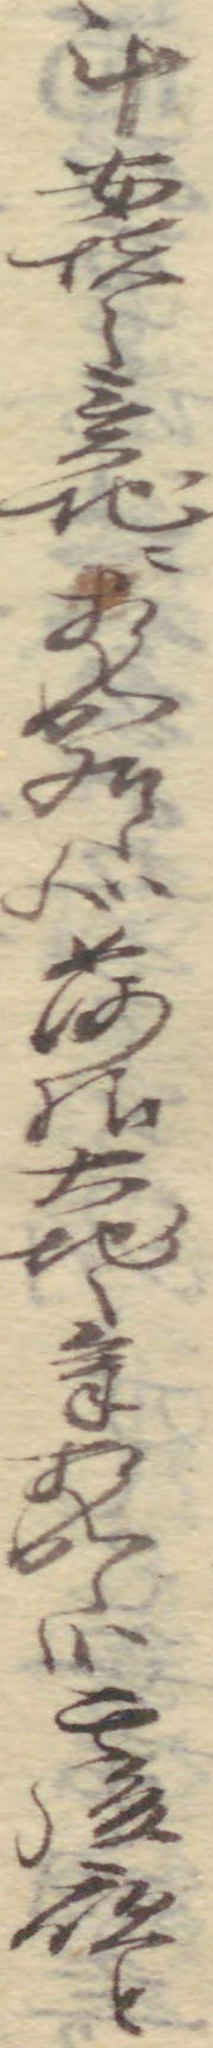計安堵の意地ニ相成居候処如何様大地之気相成候哉其後夜と
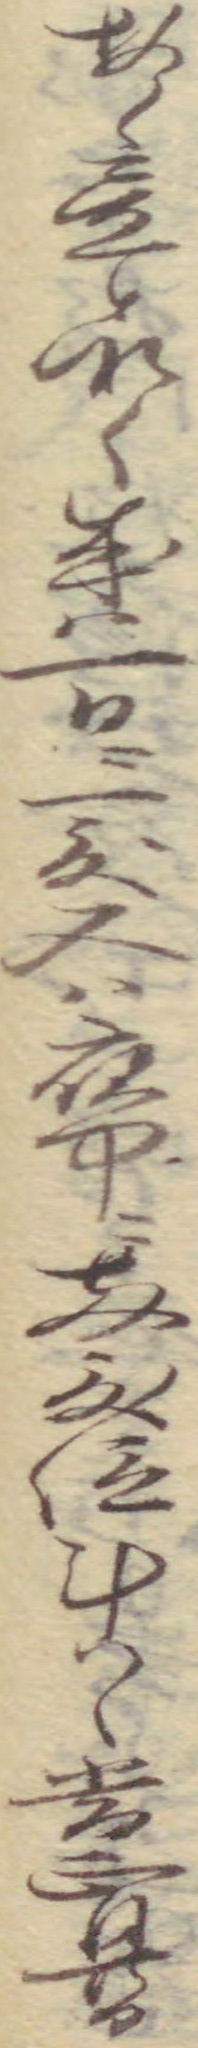なく昼となく或ハ一日ニ一度又ハ夜中ニ両度位計ツヽ当正月廿日
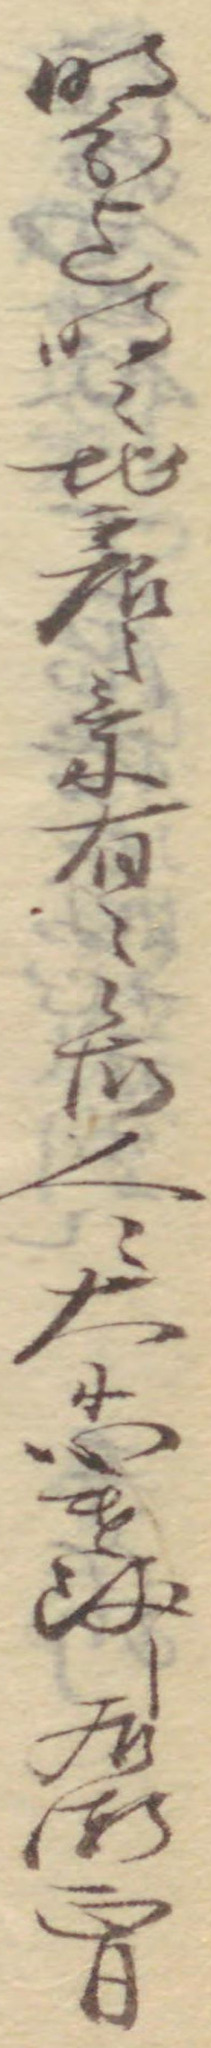時分迄時〻地震之気有之候故人〻大ニ心遣致し居漸正月
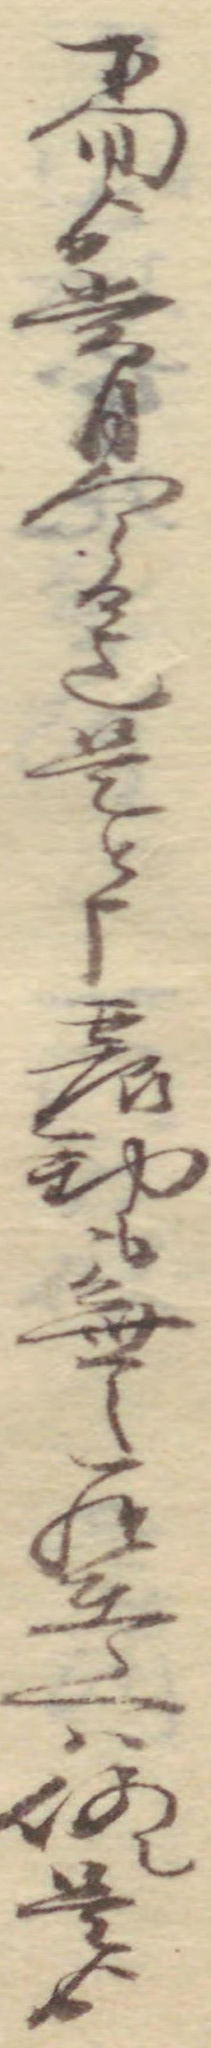下旬ゟ当月今日迄是と申震動も無之罷在候へハ何レ是ゟ
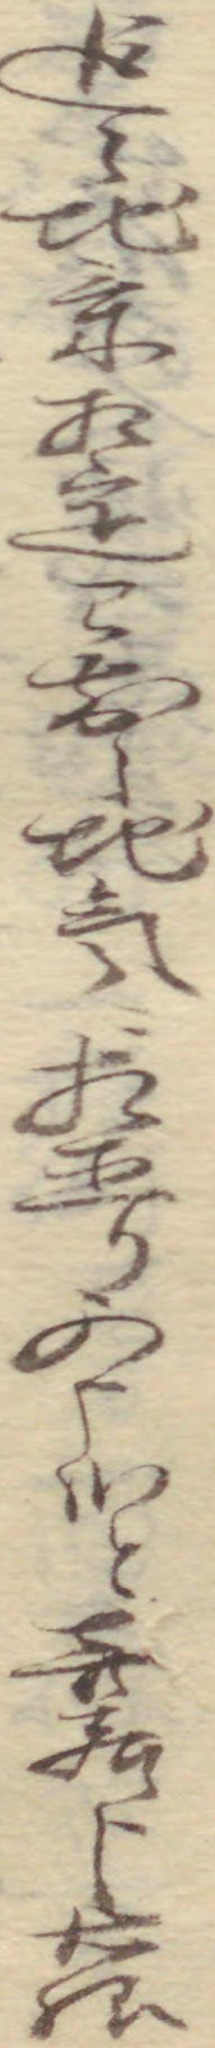追〻地気相定已前之地気ニ相直り可申哉と喜居申候右様
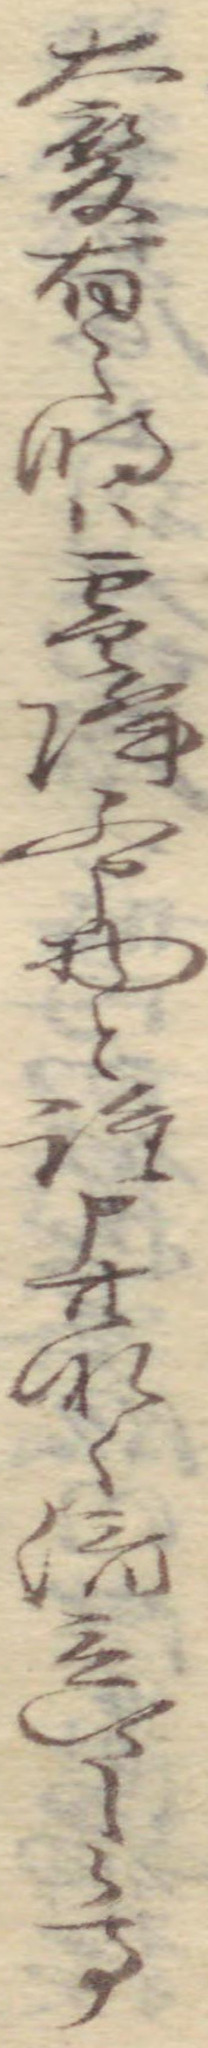大変有之時ハ雪降不申物と誰申共なく流言いたし候事
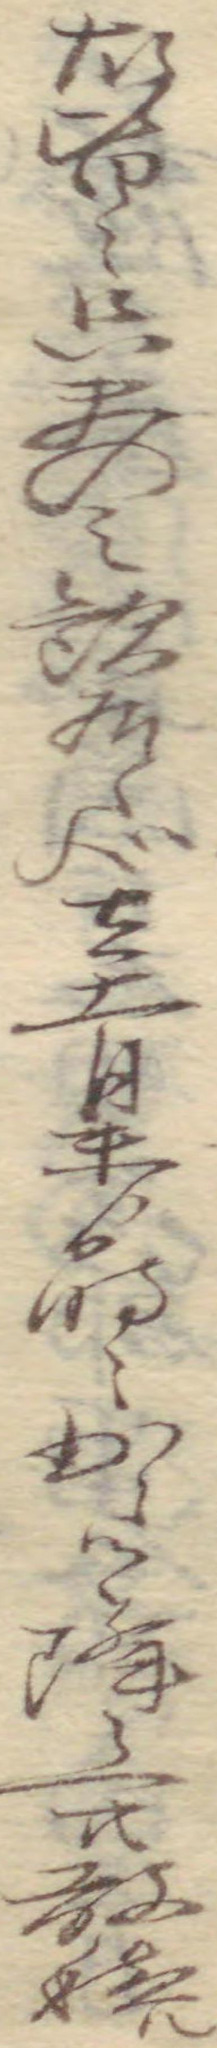故皆〻只夫のミ飲居候処去十一月末ゟ時〻少〻ツヽ降候へ共散積ル
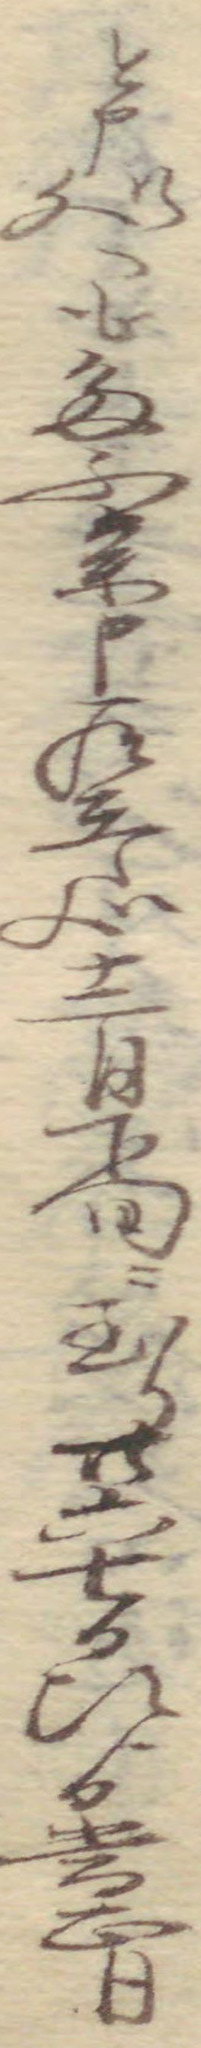と申処へも多不参申罷在候処十二月下旬ニ至り廿六七日頃ゟ当正月
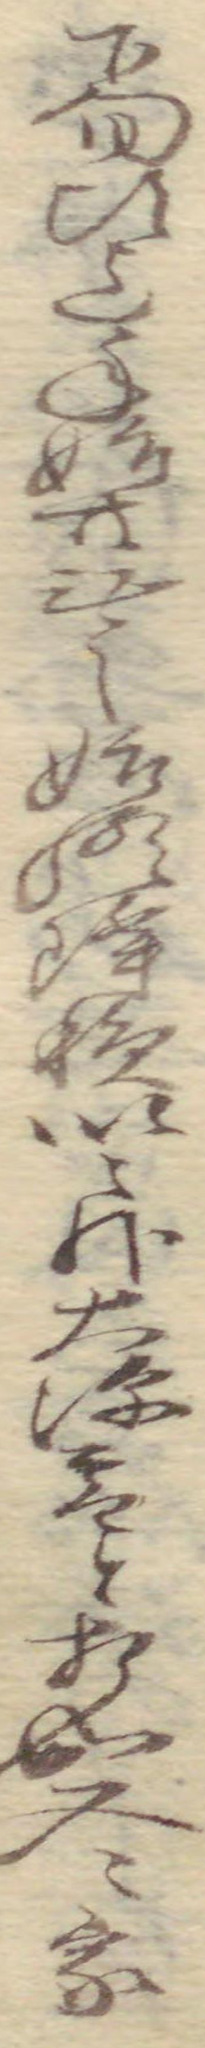下旬頃迄手始共無之始終降積以之外大深雪と相成又〻家
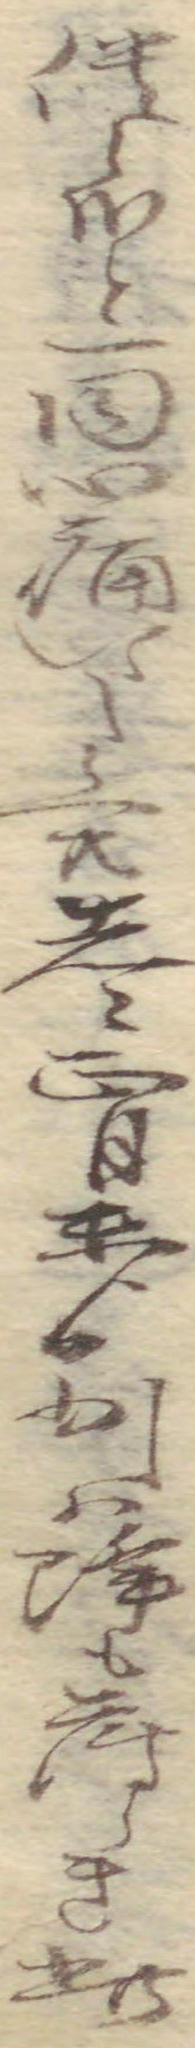潰候哉と一同心痛いたし候へ共先ニ正月来ゟ少しハ降も薄りき哉
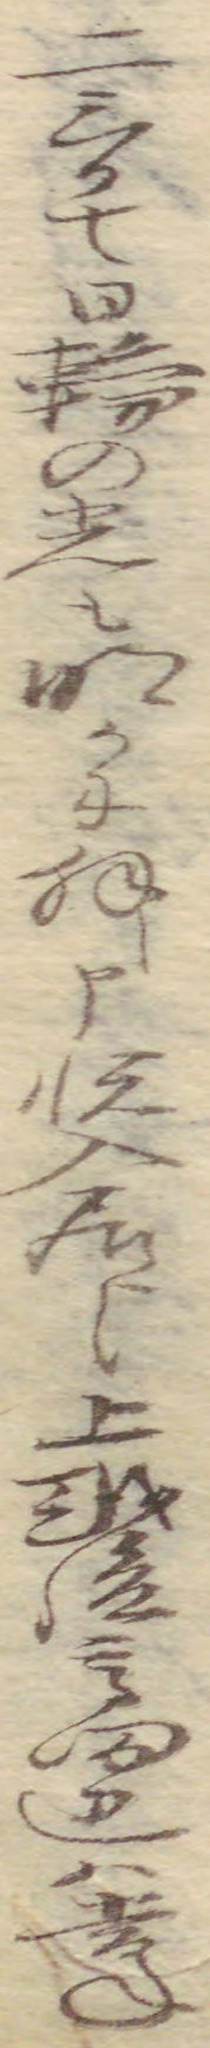二三日は日輪の光も明かに拝し申悦入居申候上越後高田辺ハ当年
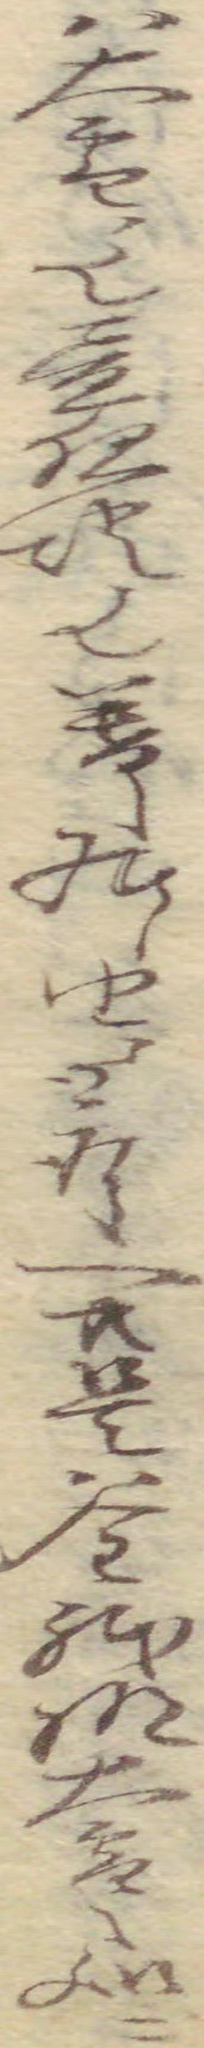ハ大雪ニて昼夜埋ニて暮し居り候由ニ御座候へ共是ハ全体故大雪之処ニ
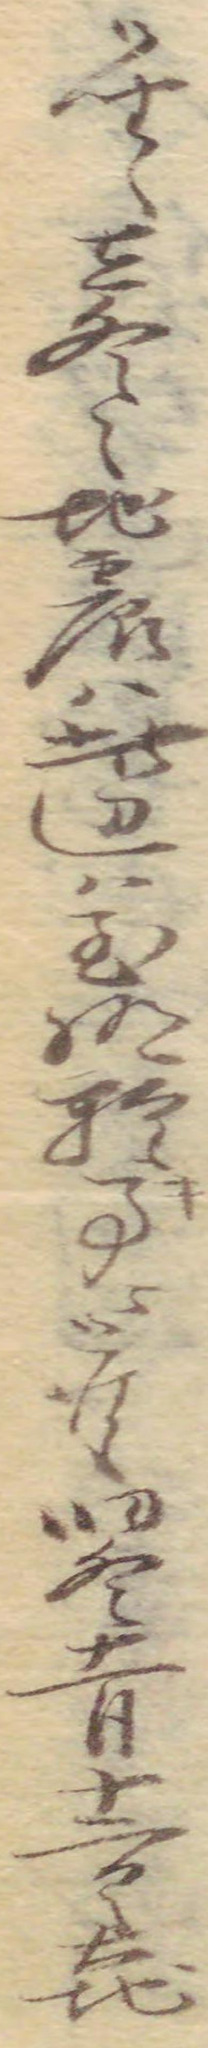御座候去冬之地震ハ此辺ハ至極珍キ事ニ御座候初冬十一月十二日之大地

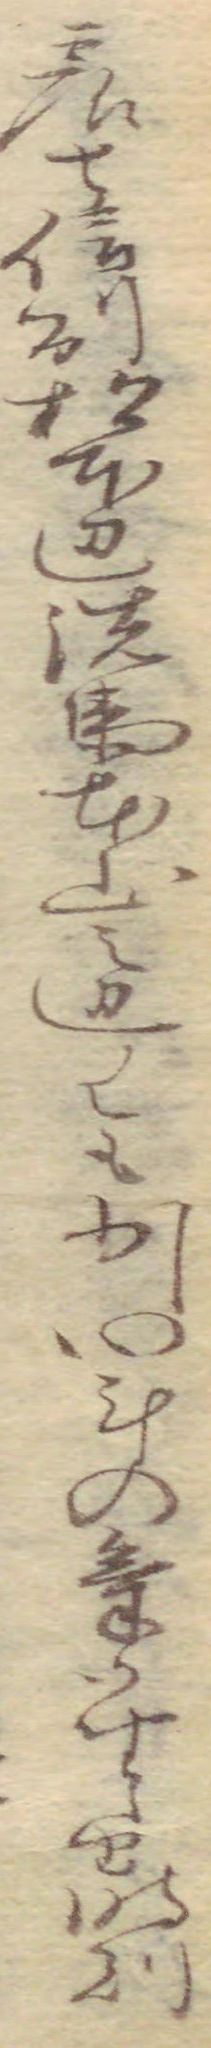震は信州松本辺洗馬本山之辺ニても少し心計の気御座候由時刻
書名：鶯宿雑記. 巻199-200
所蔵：国立国会図書館 National Diet Library, JAPAN
